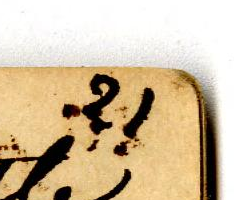21
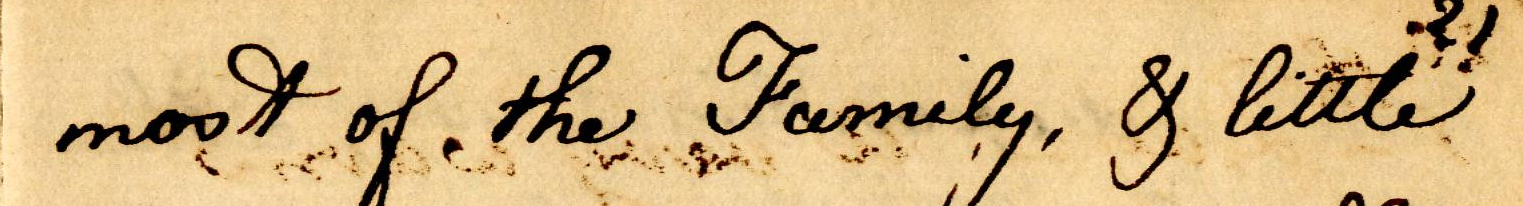most of the Family, & little
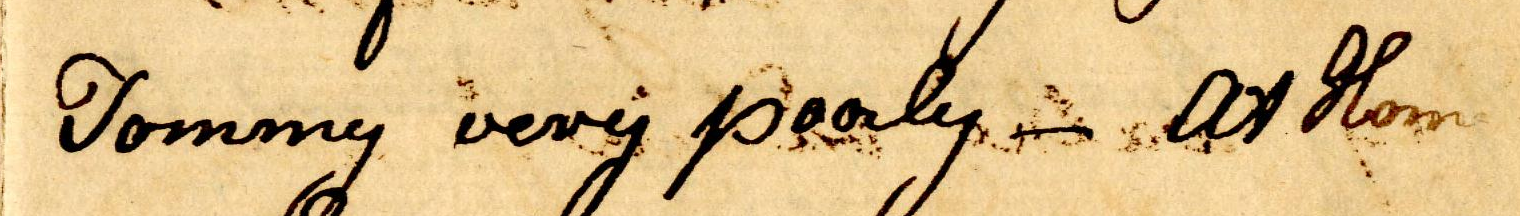Tommy very poorly- At Hom
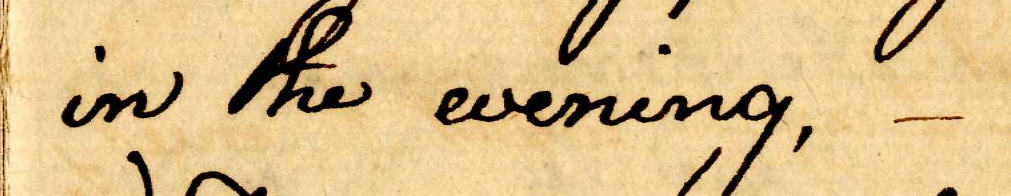in the evening,
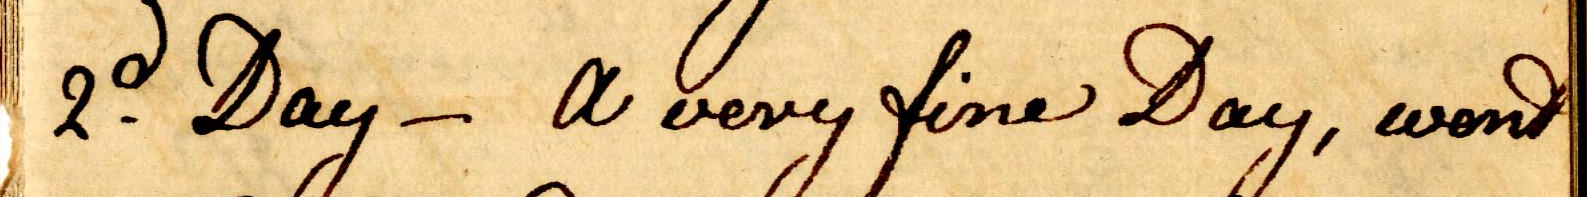2^d. Day- A very fine Day, went
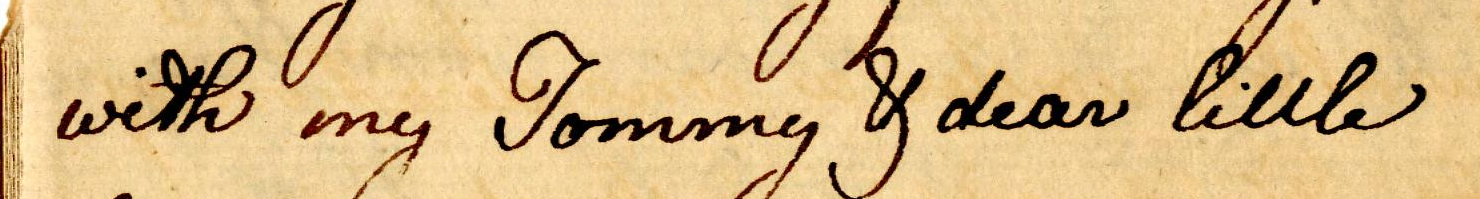with my Tommy & dear little
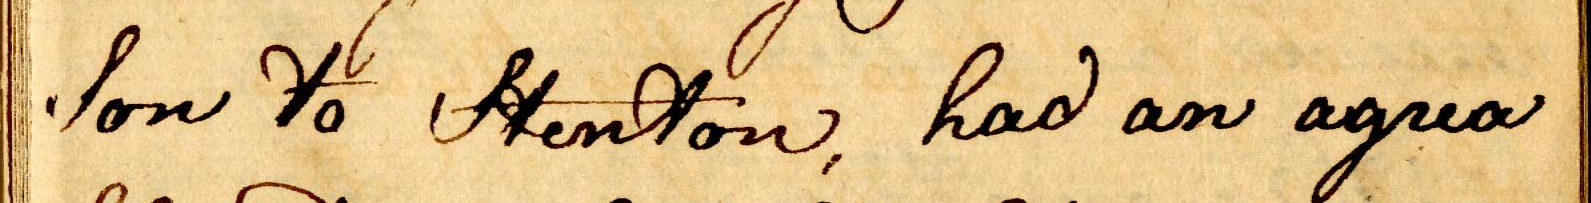Son to Stenton, had an agrea
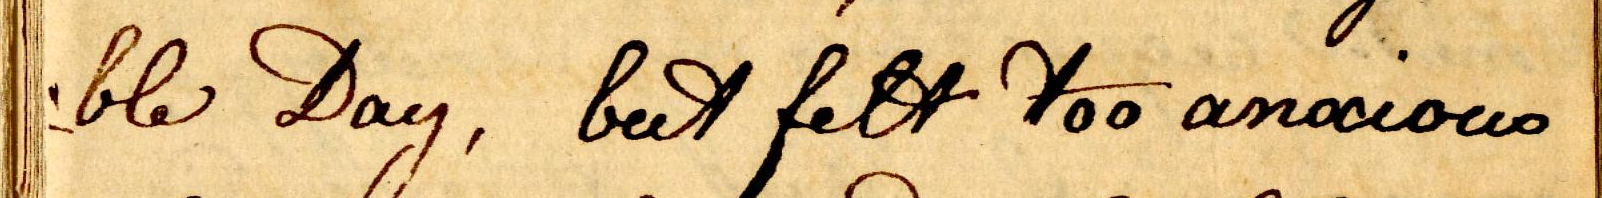-ble Day, but felt too anxious
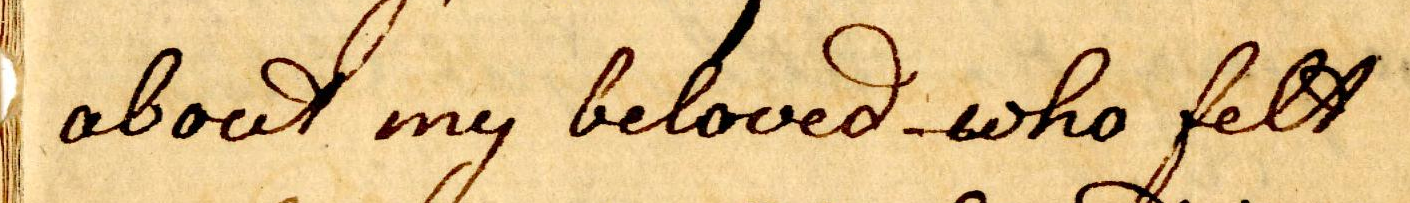about my beloved- who felt
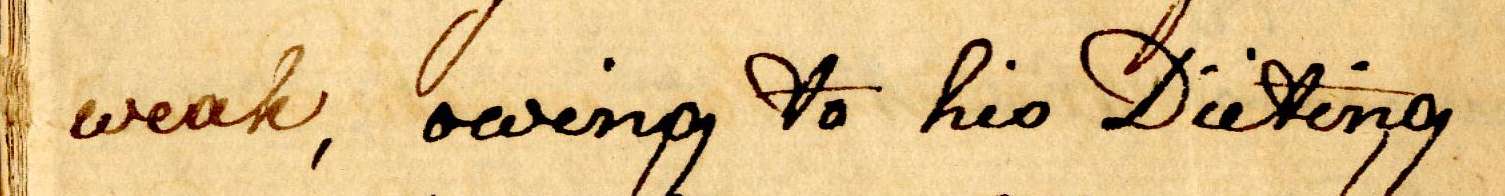weak, owing to his Dieting
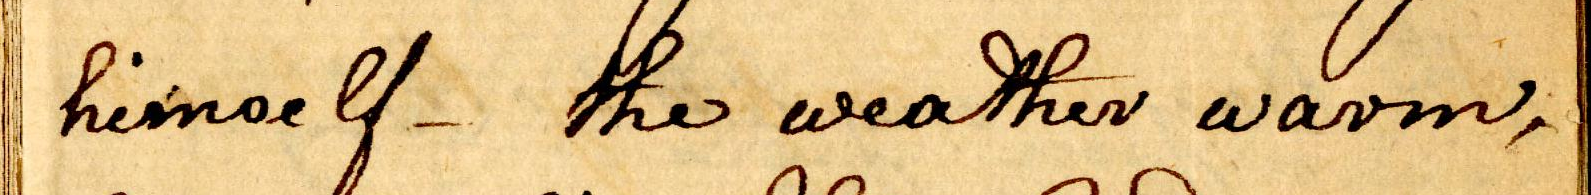himself- the weather warm,
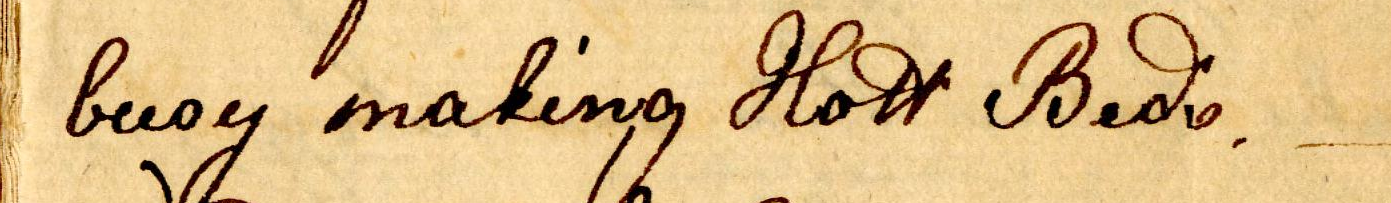busy making Hott Beds
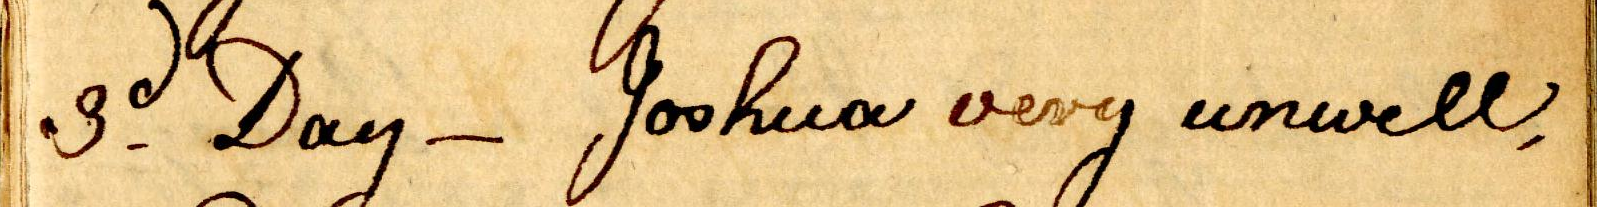3^d Day- Joshua very unwell,
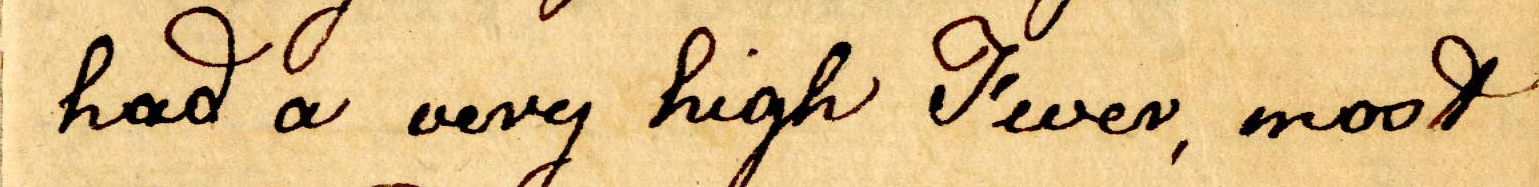had a very high Fever, most
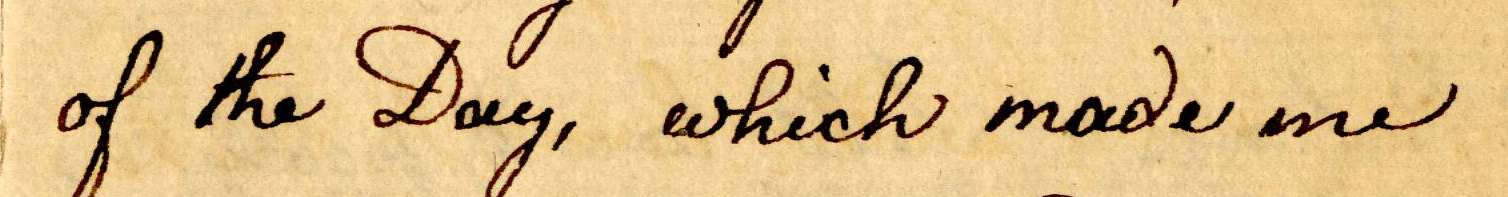of the Day, which made me
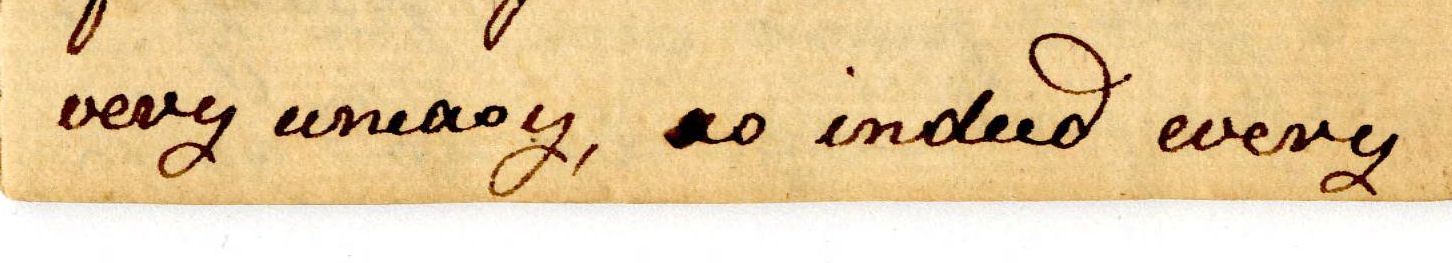very uneasy, as indeed every
